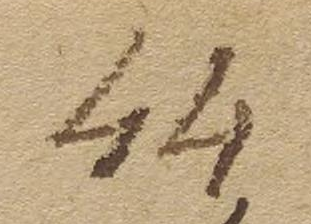44
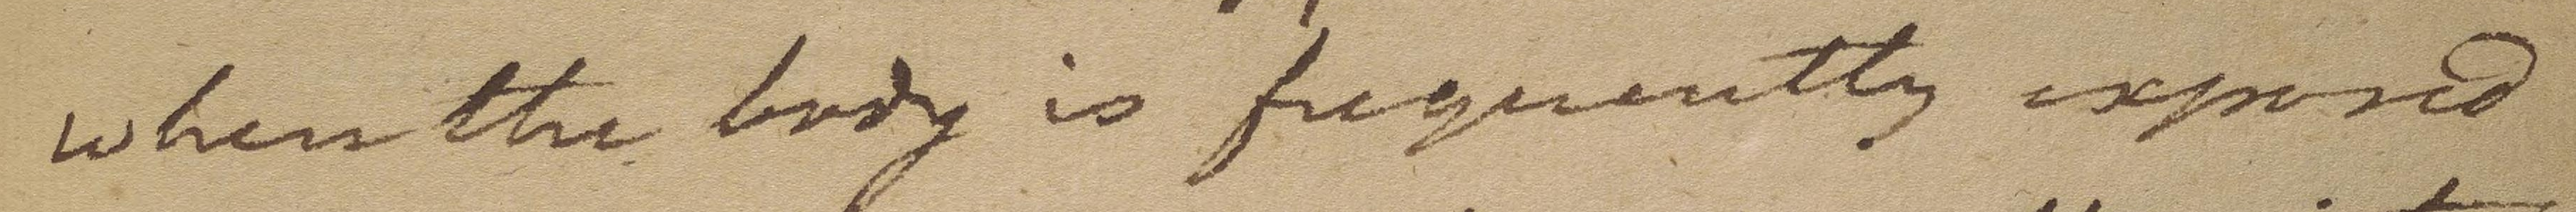when the body is frequently exposed
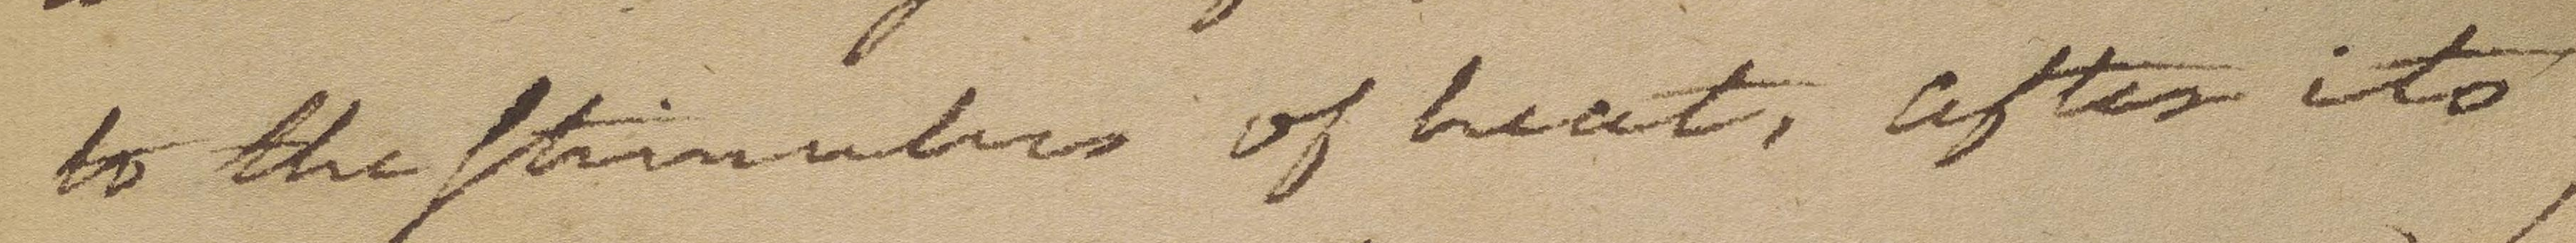to the Stimulus of heat, after its
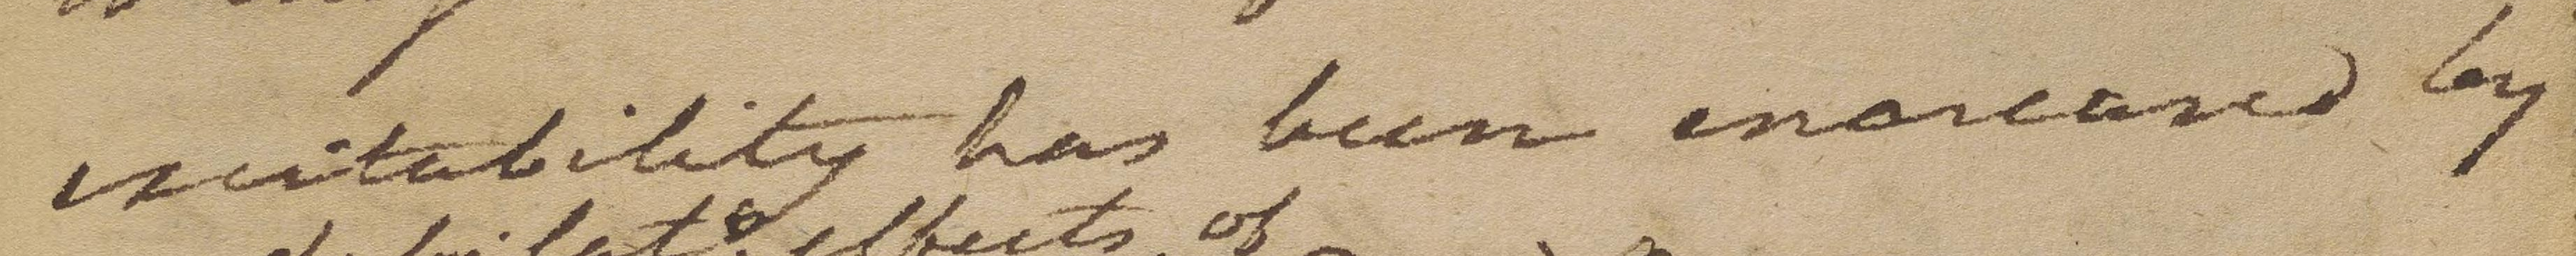excitabilty has been encreased by
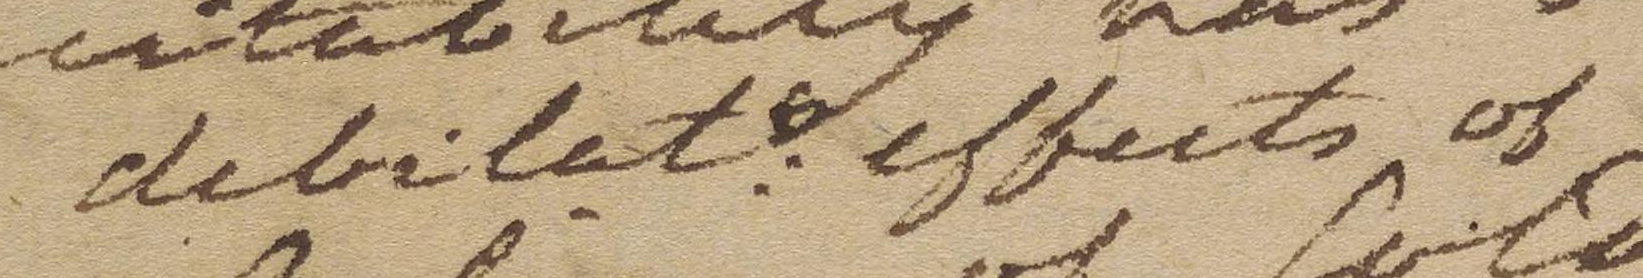debiliat^d effects of
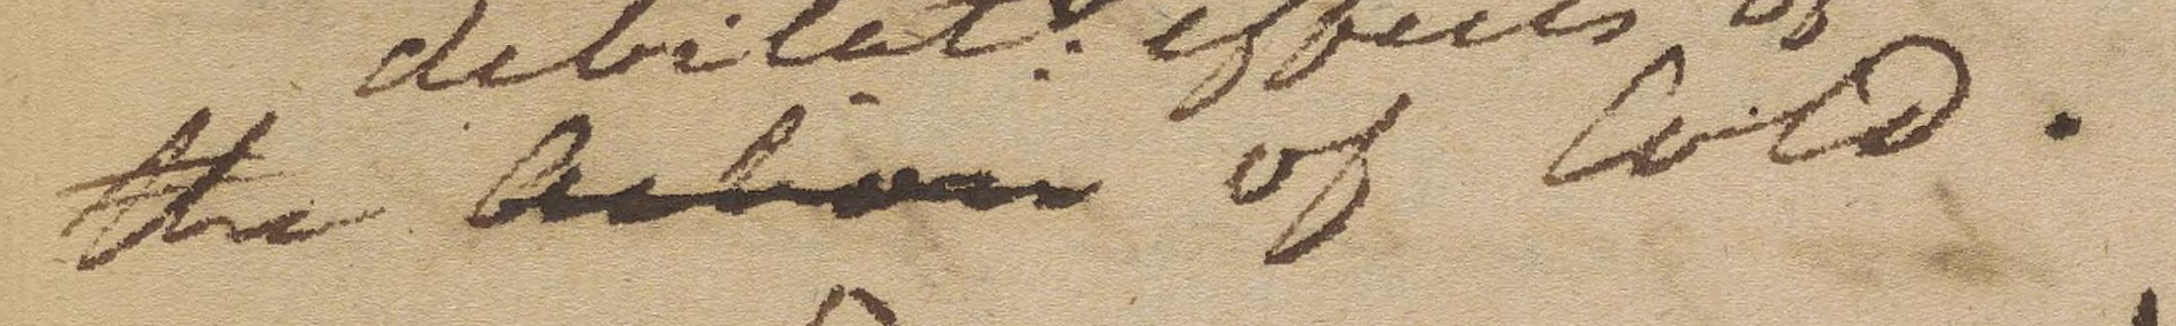the [Action] of cold.
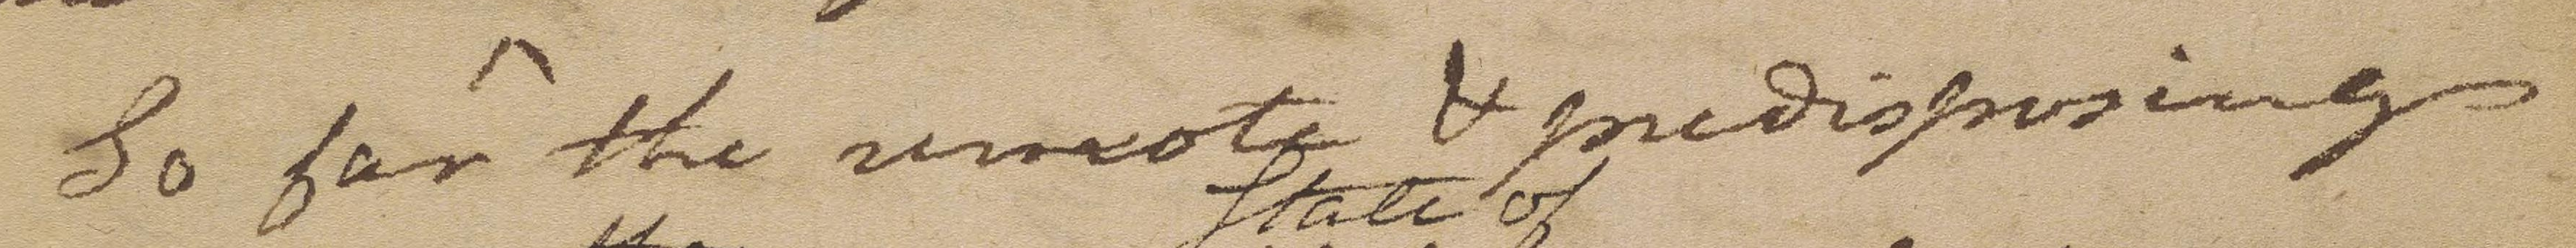So far the remote & predisposing
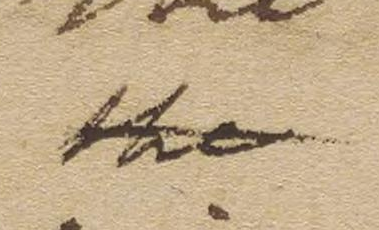the
